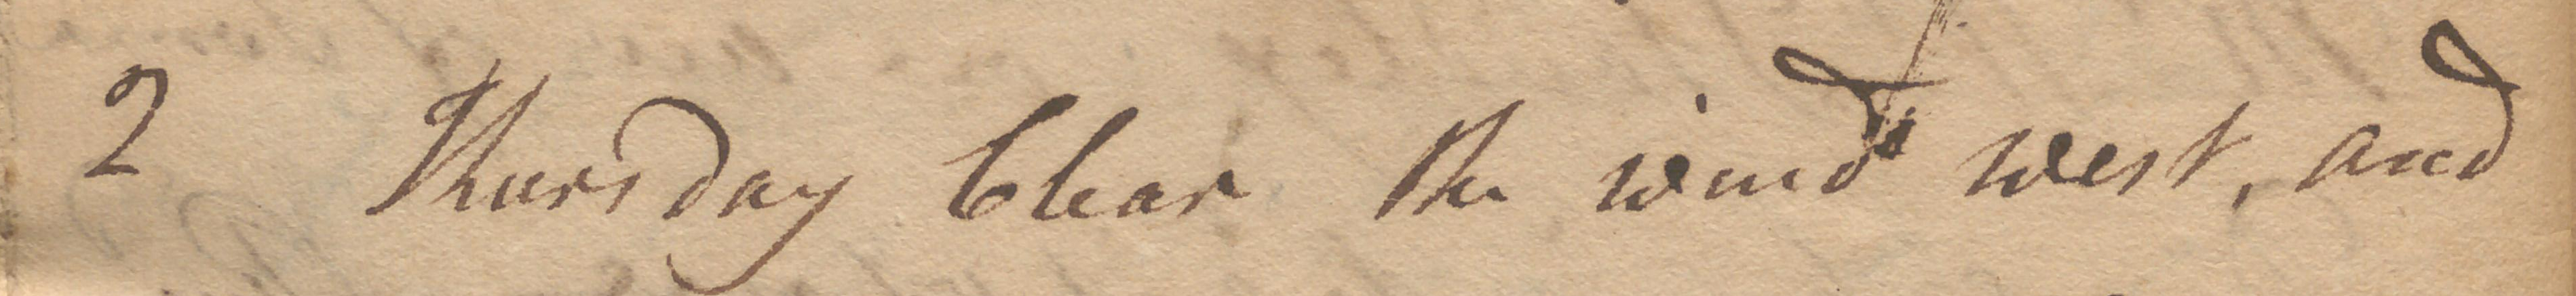2 Thursday Clear the wind west, and
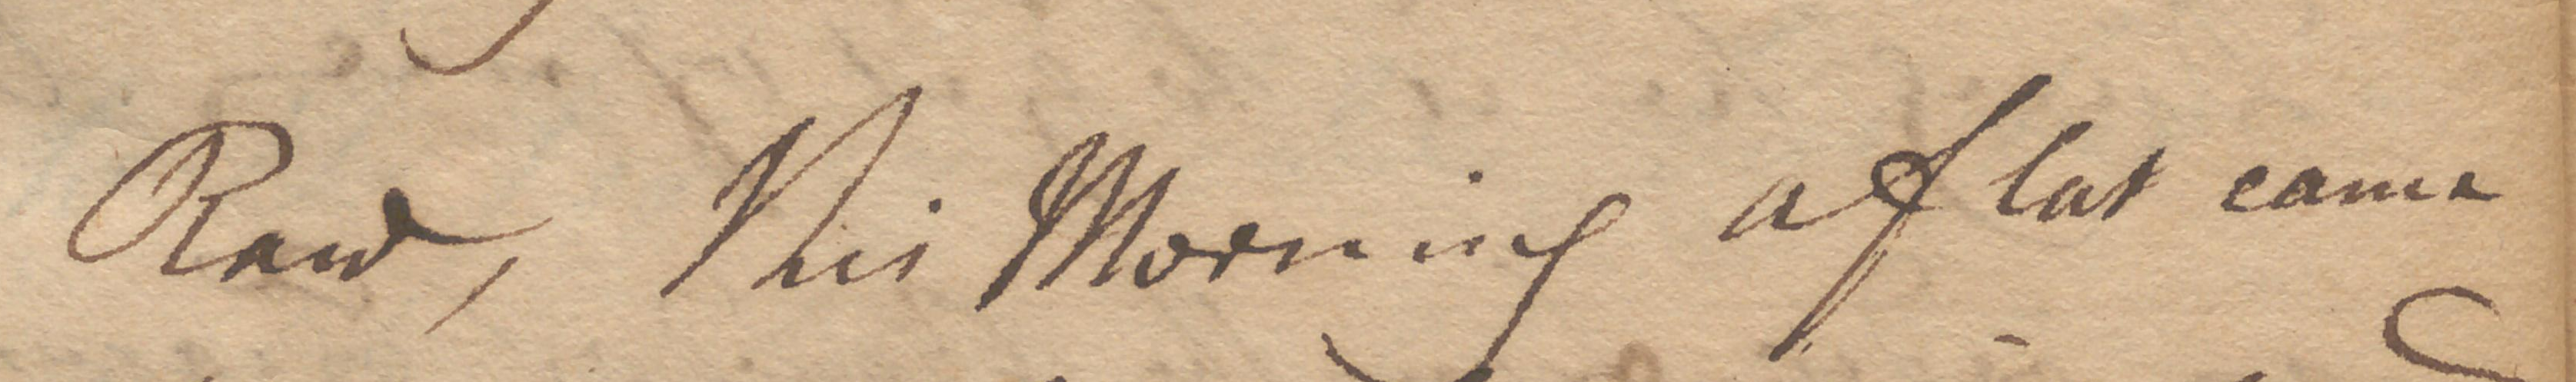Raw, This Morning a flat came
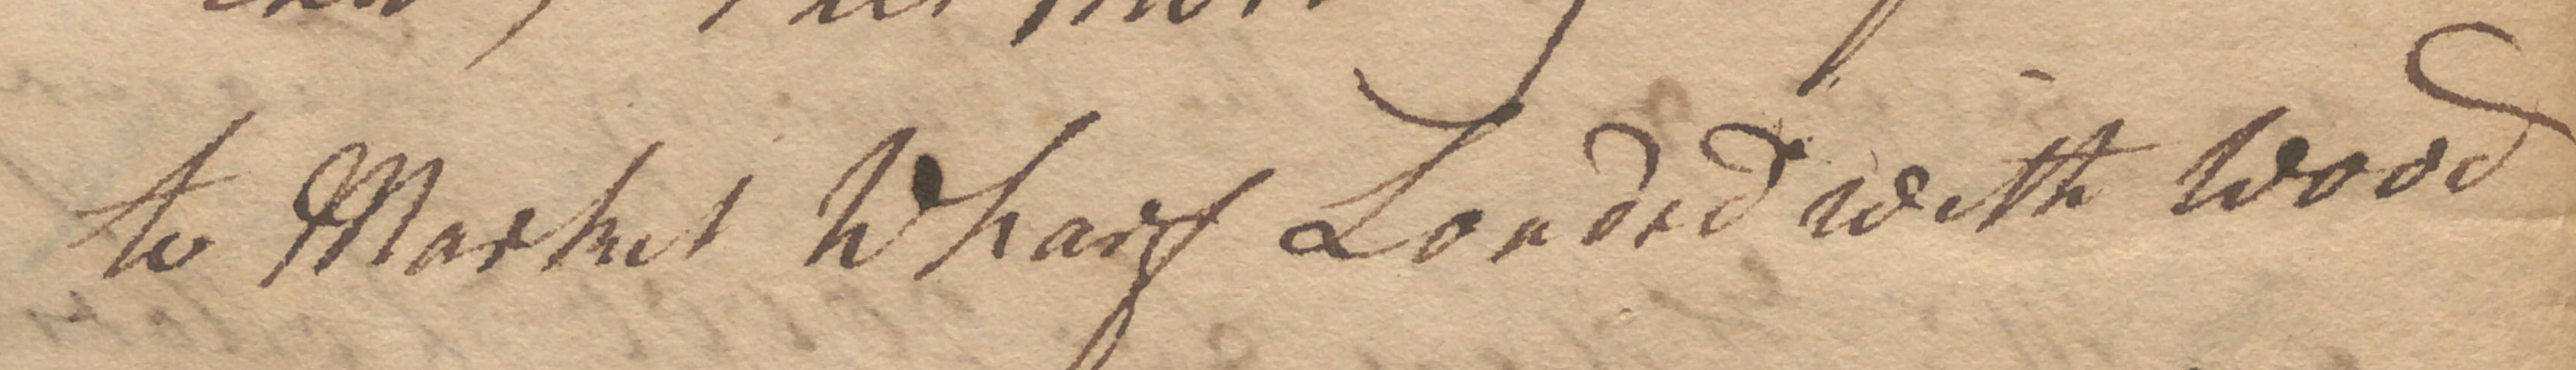to Market Wharf Loaded with Wood
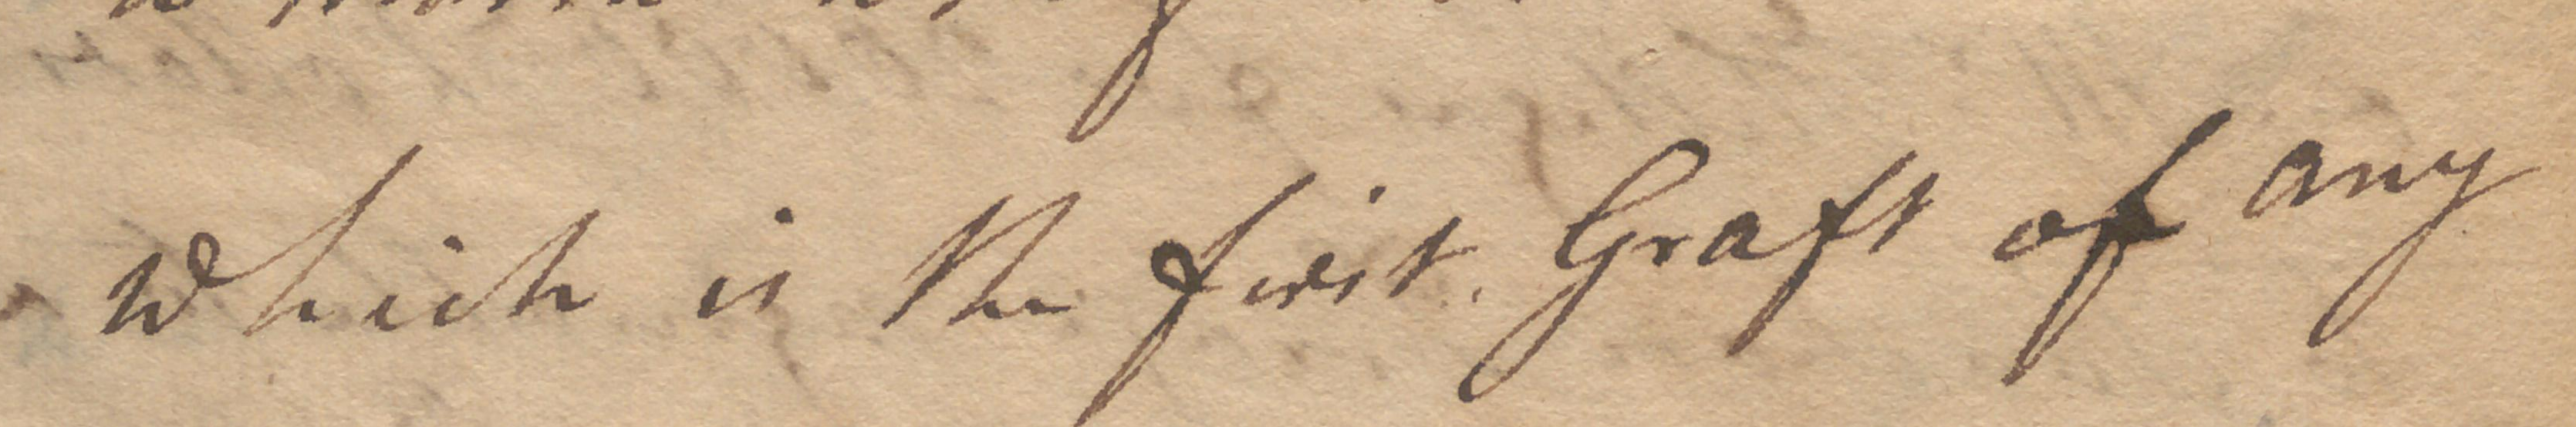which is the first Graft of any
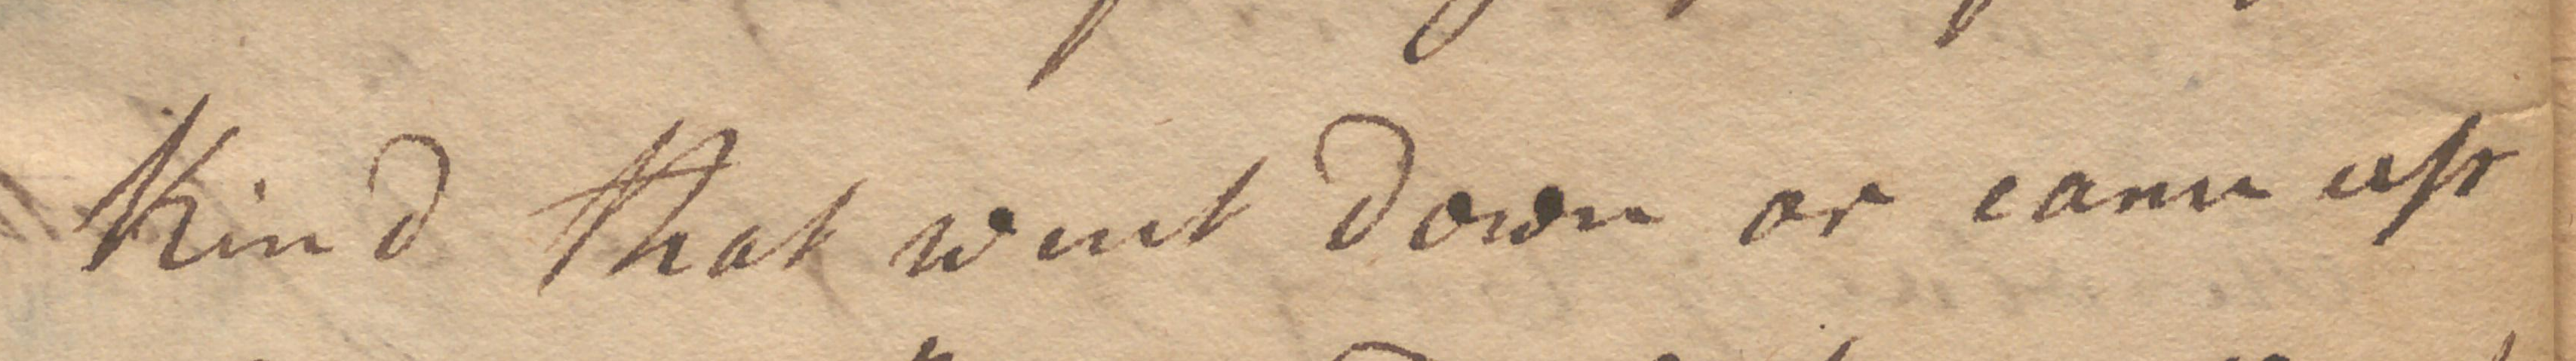kind that went down or came up
